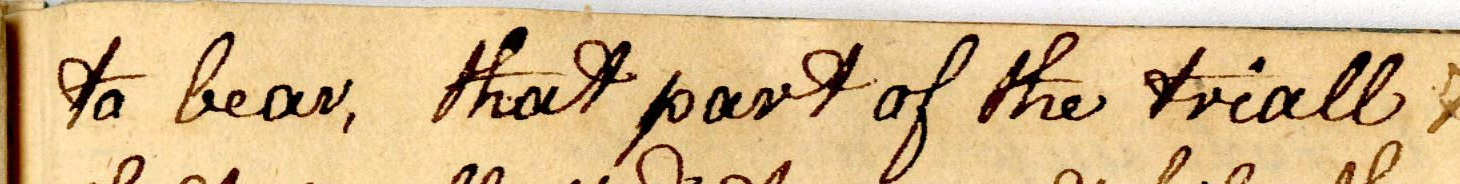to bear, that part of the triall
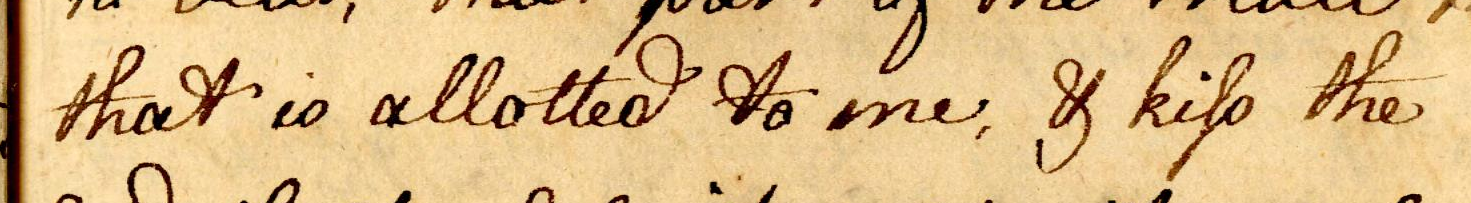that is allotted to me, & kiss the
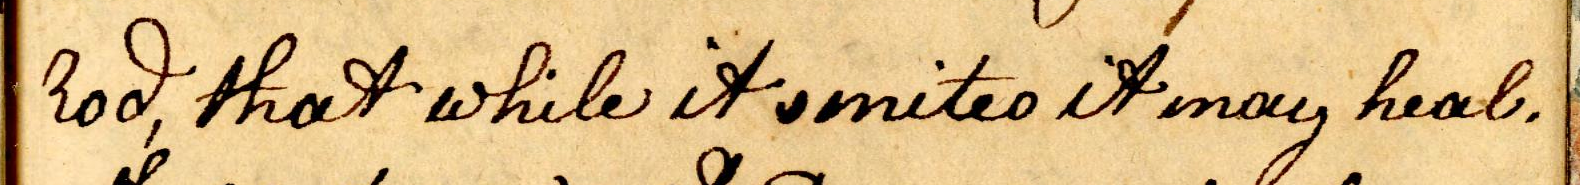rod, that while it smites it may heal,
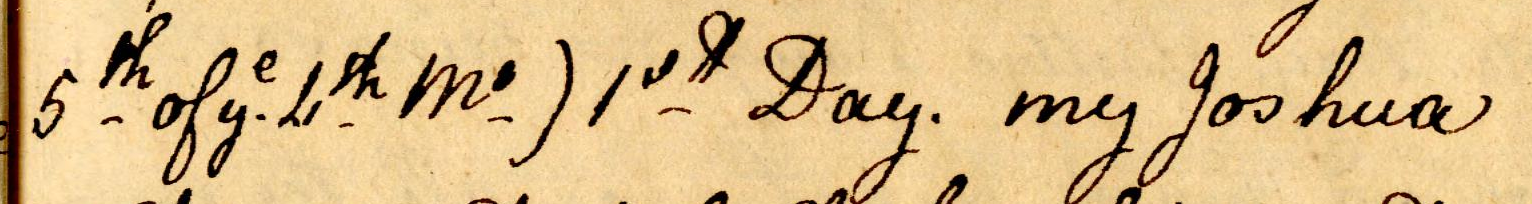5^th of y^e 4^th M^o ) 1^st Day. my Joshua
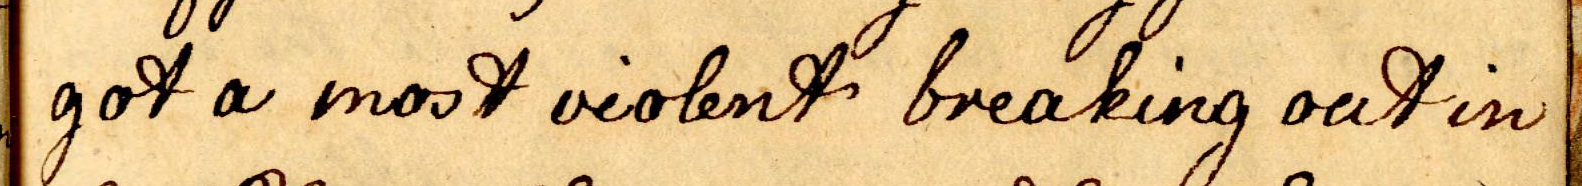got a most violent breaking out in
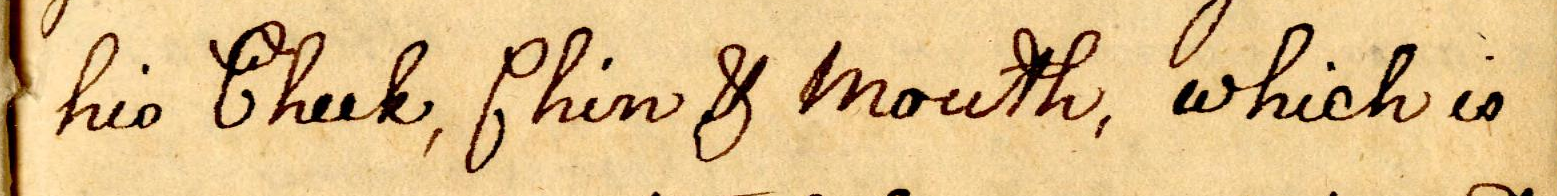his Cheek, Chin & Mouth, which is
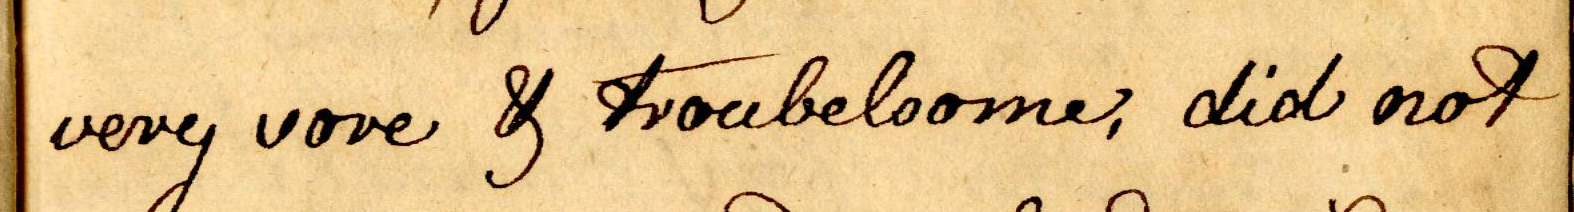very sore & troubelsome, did not
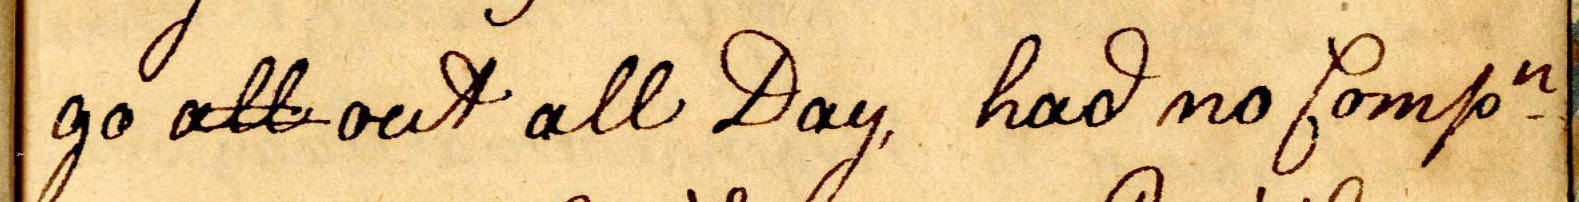go [all] out all Day, had no Comp^n
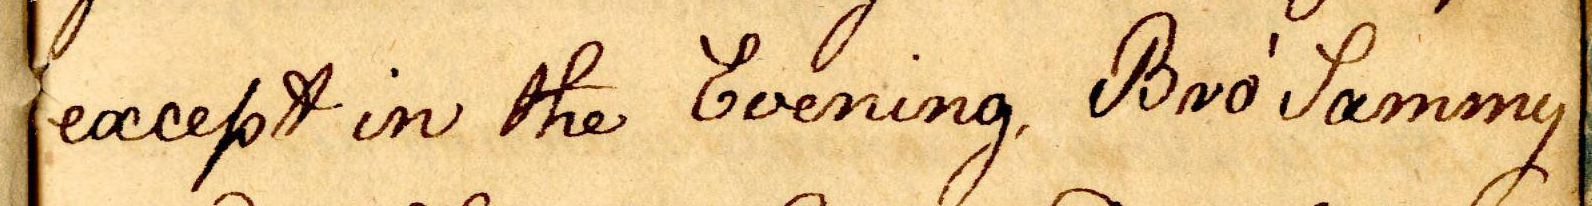except in the Evening, Bro' Sammy
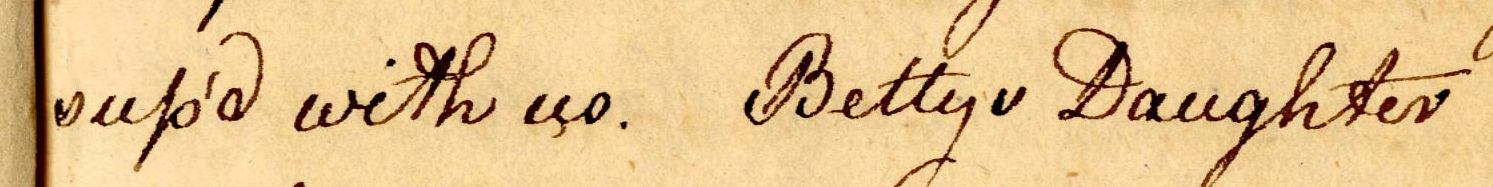sup'd with us. Bettys Daughter
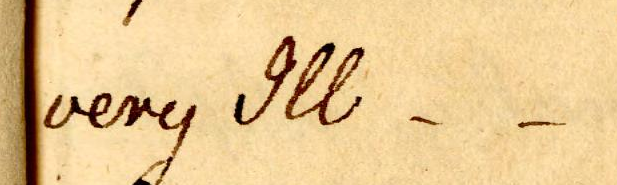very Ill--
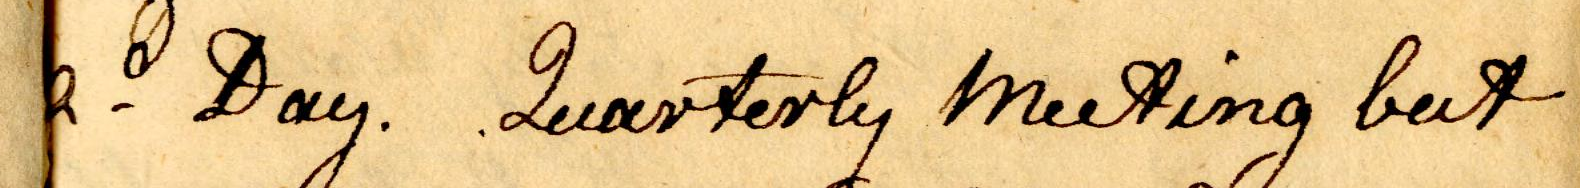2^d Day. Quarterly Meeting but
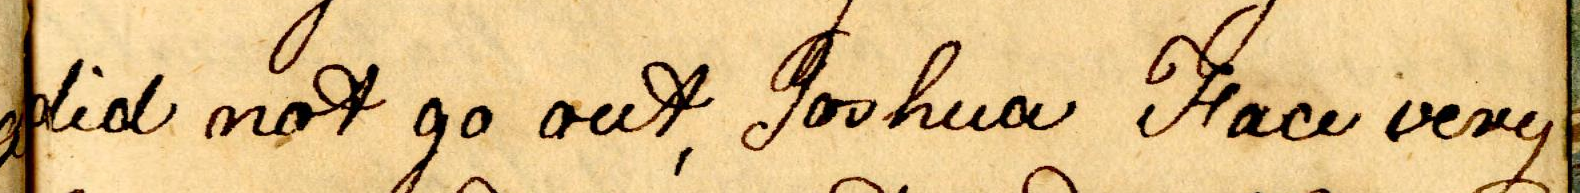did not go out, Joshua Face very
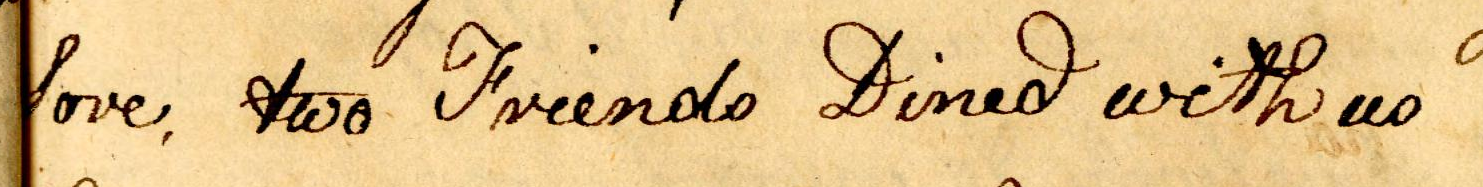sore, two Friends Dined with us
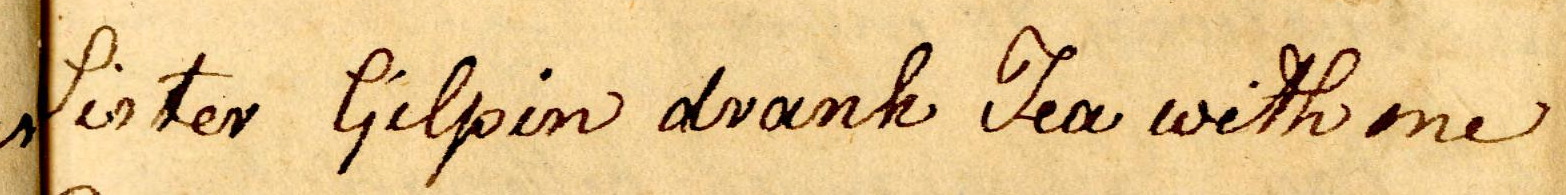Sister Gilpin drank Tea with me
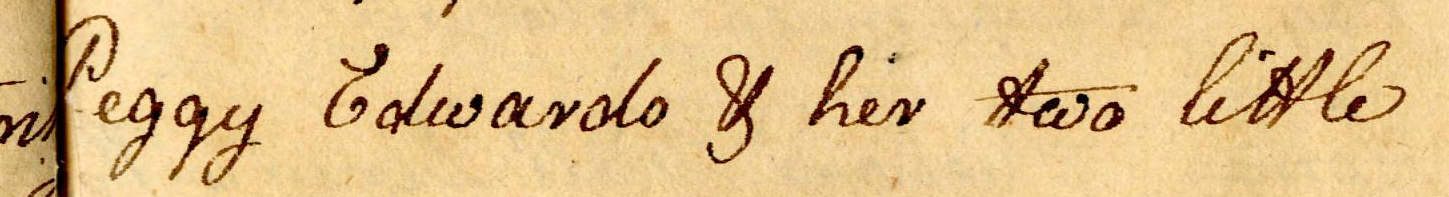Peggy Edwards & her two little
